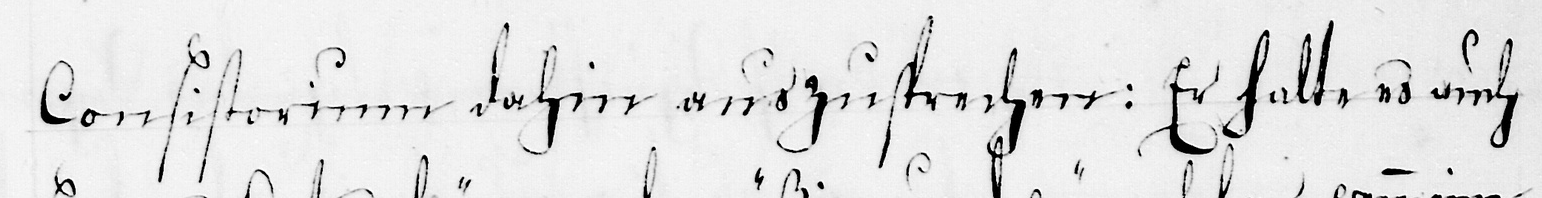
Consistorium dahin auszusprechen: Er halte es auch
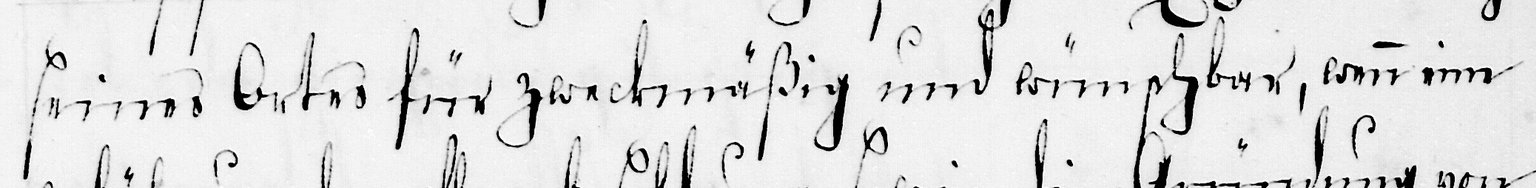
seines Ortes für zweckmäßig und wünschbar, wenn eine
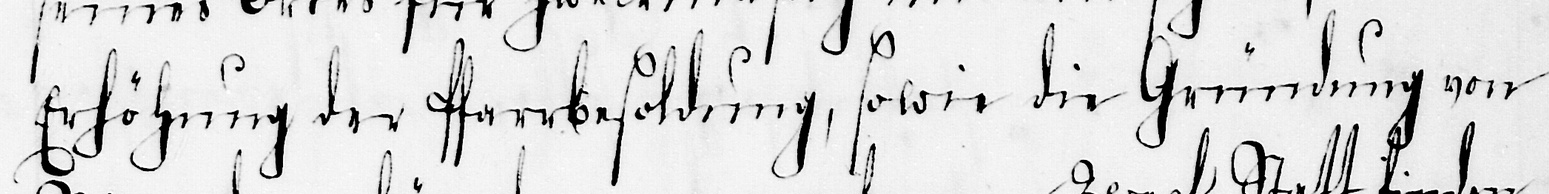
Erhöhung der Pfarrbesoldung, sowie die Gründung von
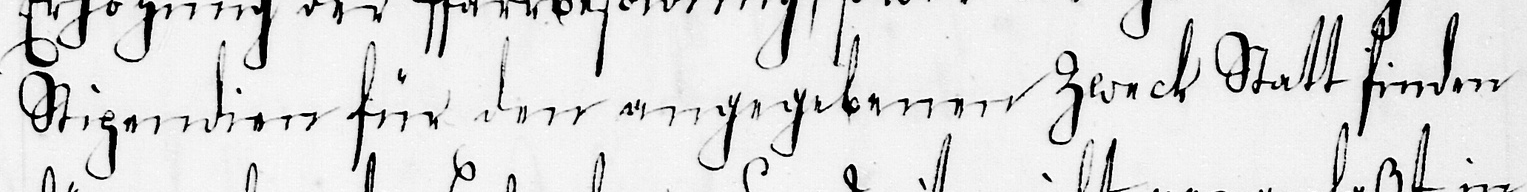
Stipendien für den angegebenen Zweck Statt finden
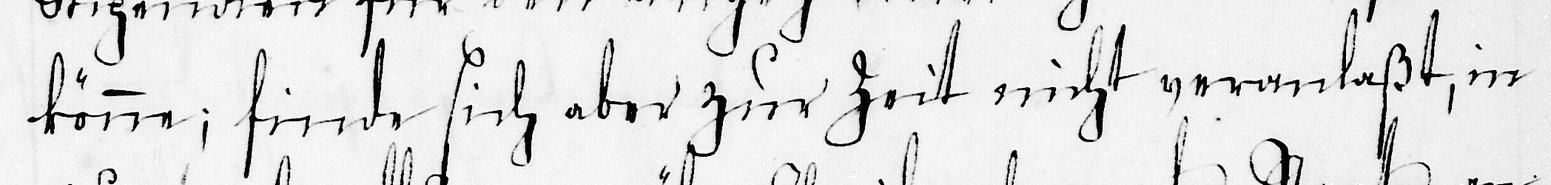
könne; finde sich aber zur Zeit nicht veranlaßt, in
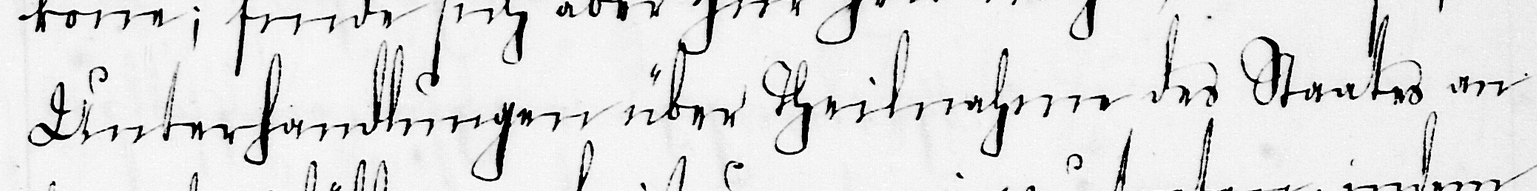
Unterhandlungen über Theilnahme des Staates an
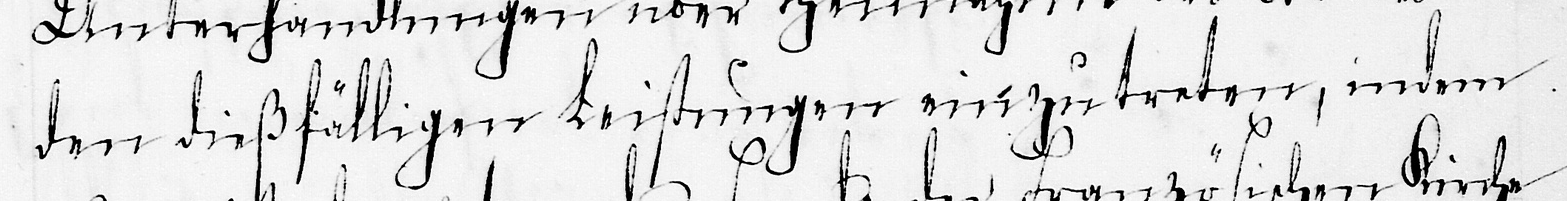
den dießfälligen Leistungen einzutreten, indem
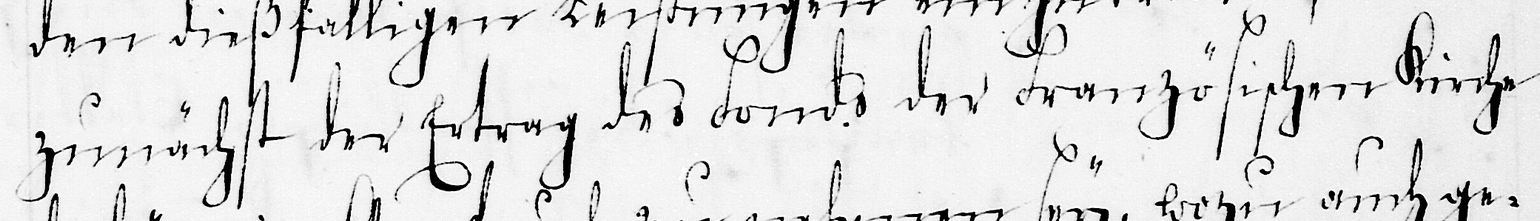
zunächst der Ertrag des Fonds der Französischen Kirche
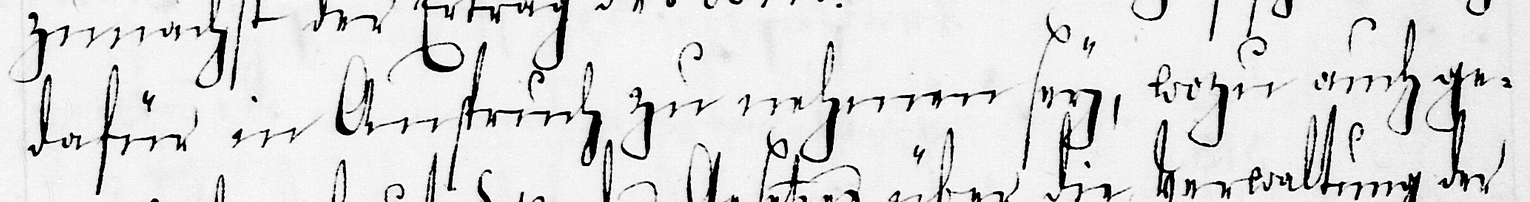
dafür in Anspruch zu nehmen sey, wozu auch ge¬
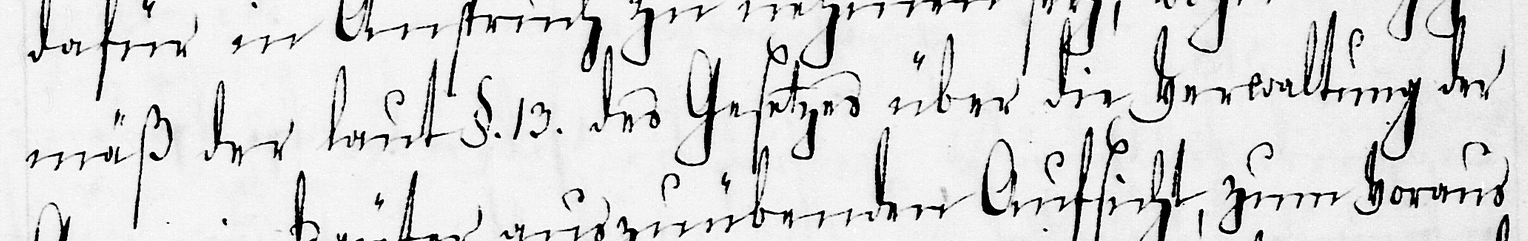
mäß der laut §. 13. des Gesetzes über die Verwaltung der
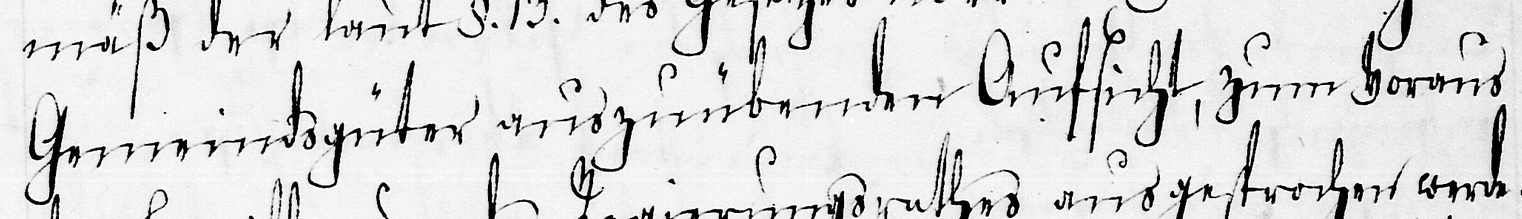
Gemeindsgüter auszuübenden Aufsicht, zum Voraus
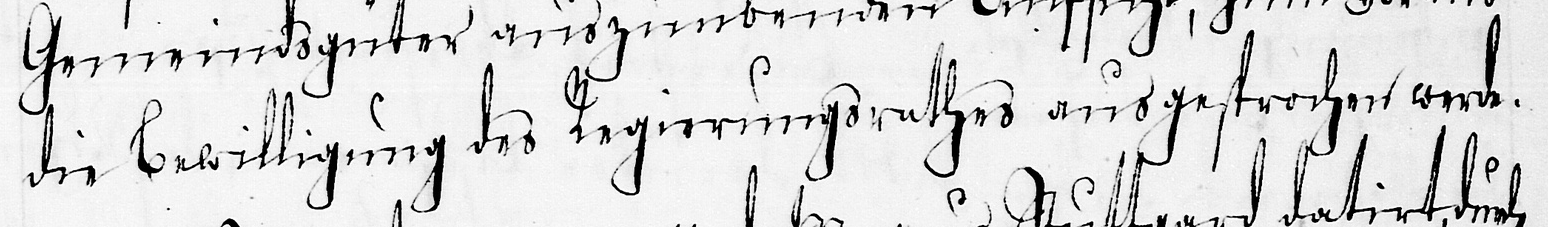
die Bewilligung des Regierungsrathes ausgesprochen werde.
